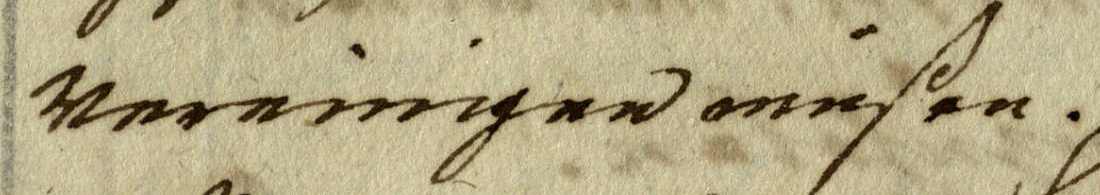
vereinigen müßen.
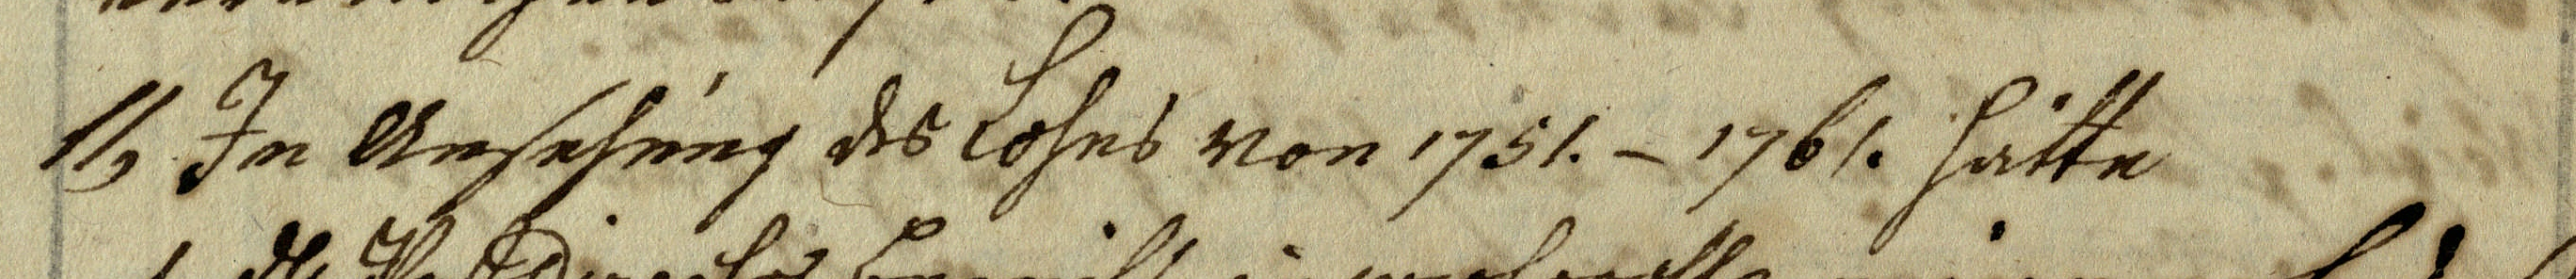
II, In Ansehung des Lohns von 1751.-1761. hätte
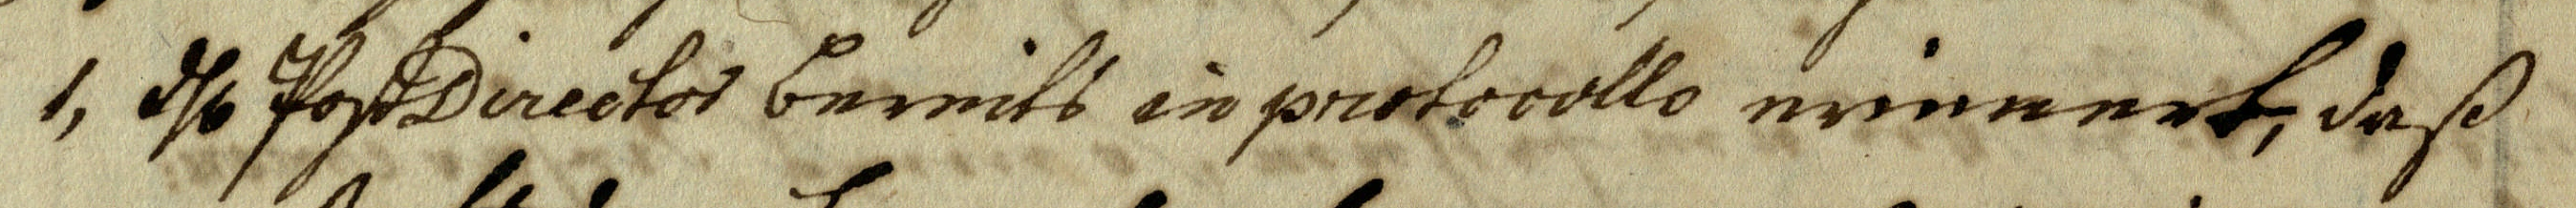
1, dh PostDirector bereits in protocollo erinnert, daß
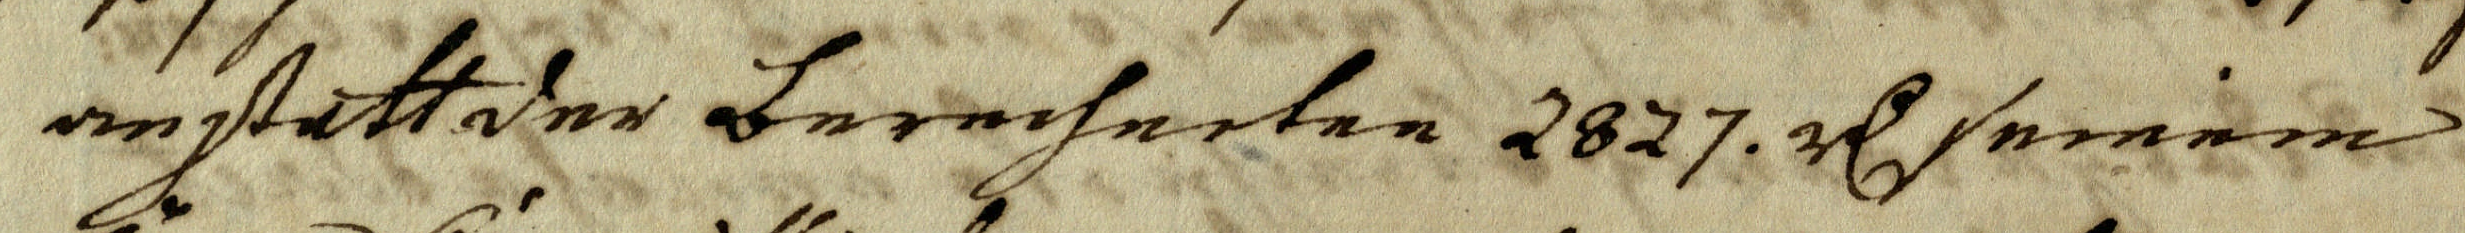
anstatt der berechneten 2827. rt seinem
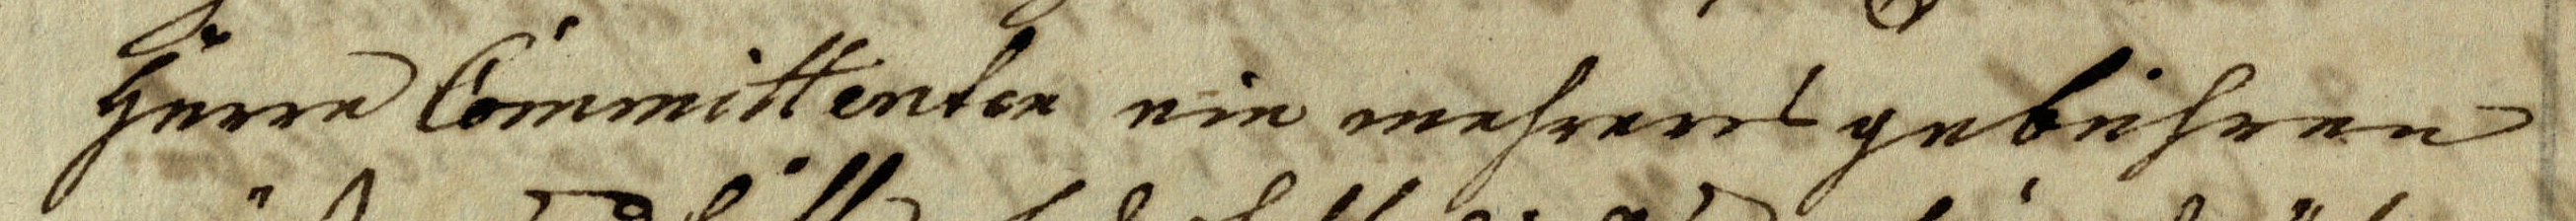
Herrn Committenten ein mehreres gebühren
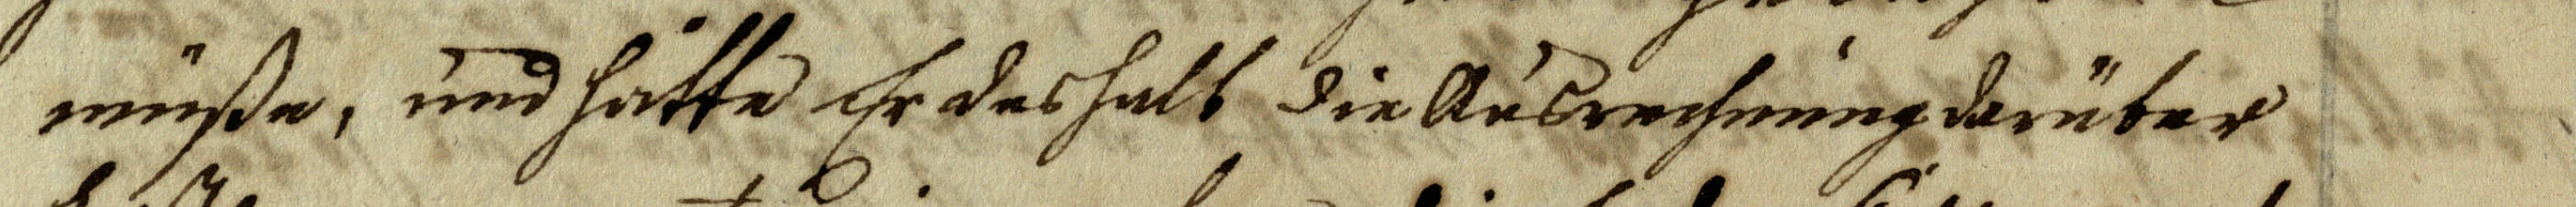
müße, und hätte Er deshalb die Anrechnung darüber
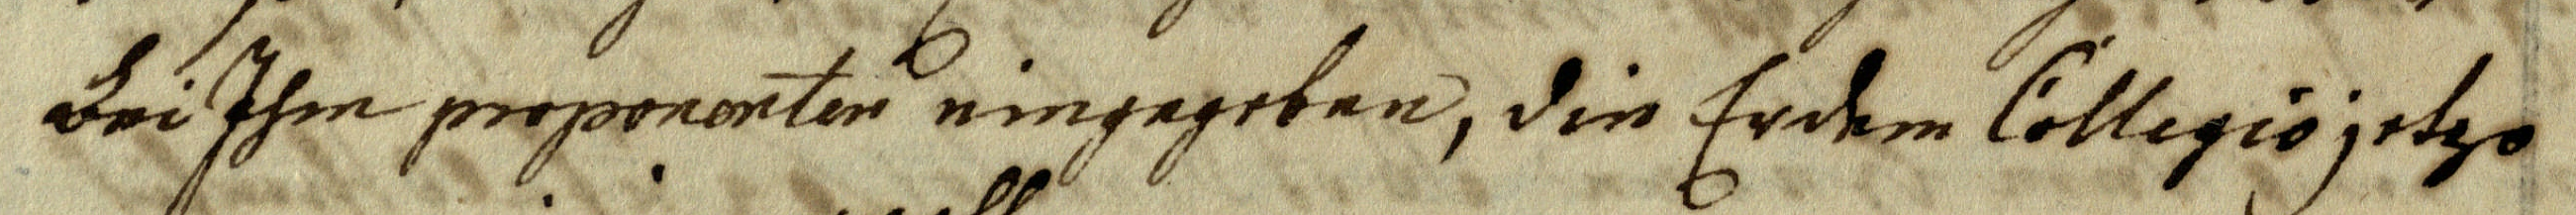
bei Ihm proponenten eingegeben, die Er dem Collegio jetzo
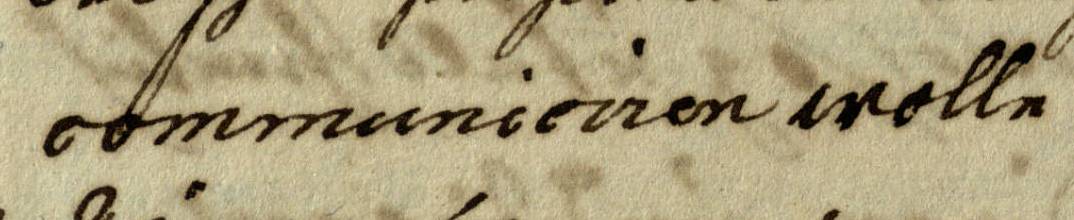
communiciren wolle.
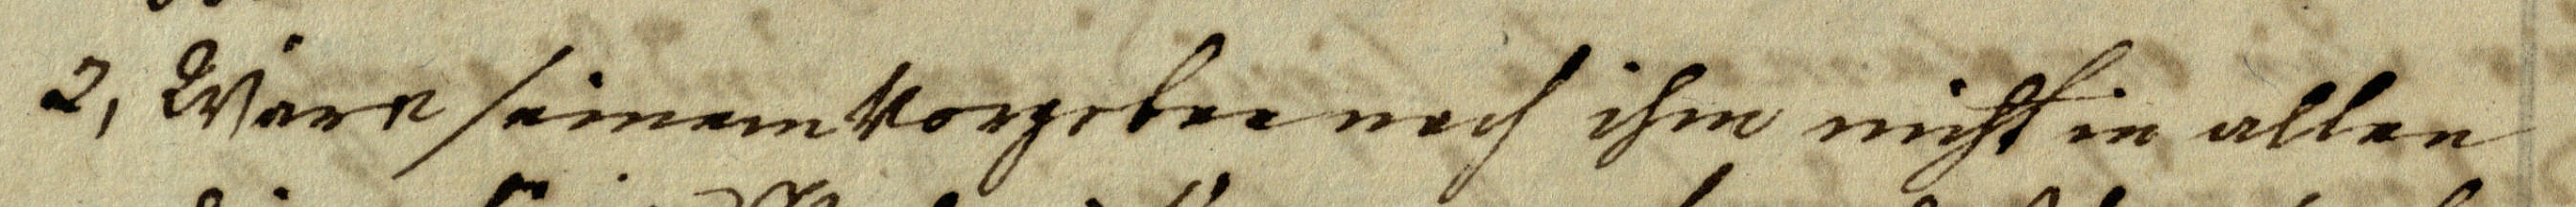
2, Wäre seinem Vorgeben nach ihm nicht in allen
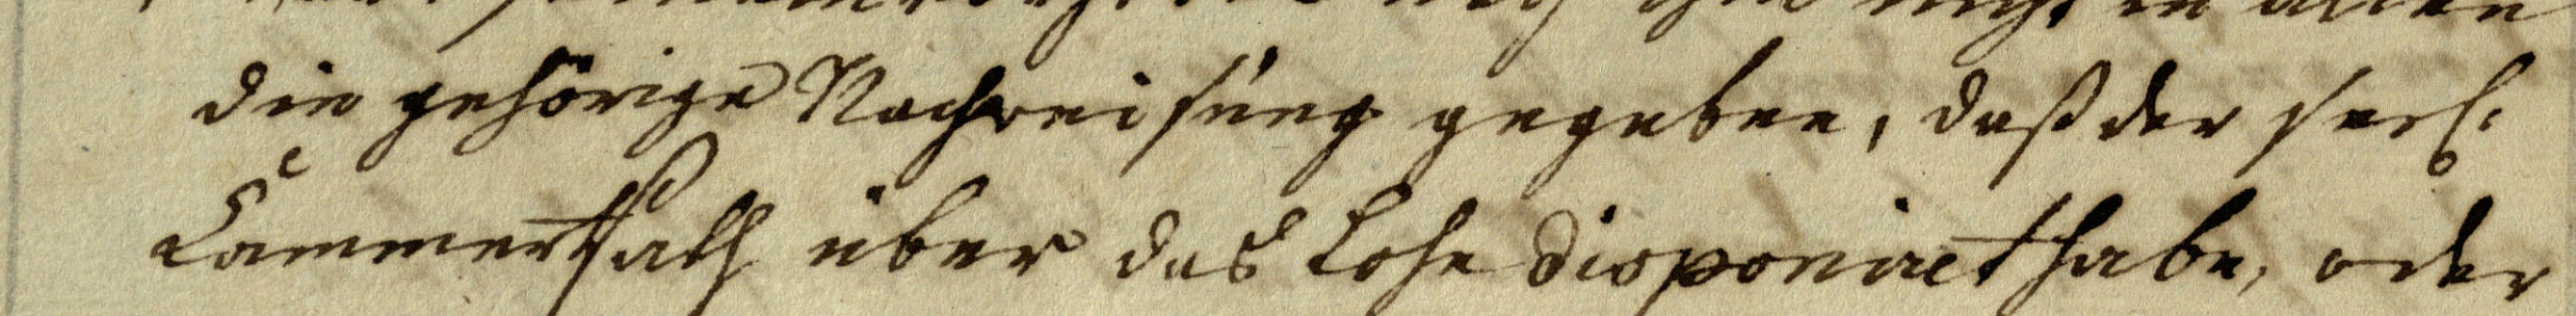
die gehörige Nachweisung gegeben, daß der seel.
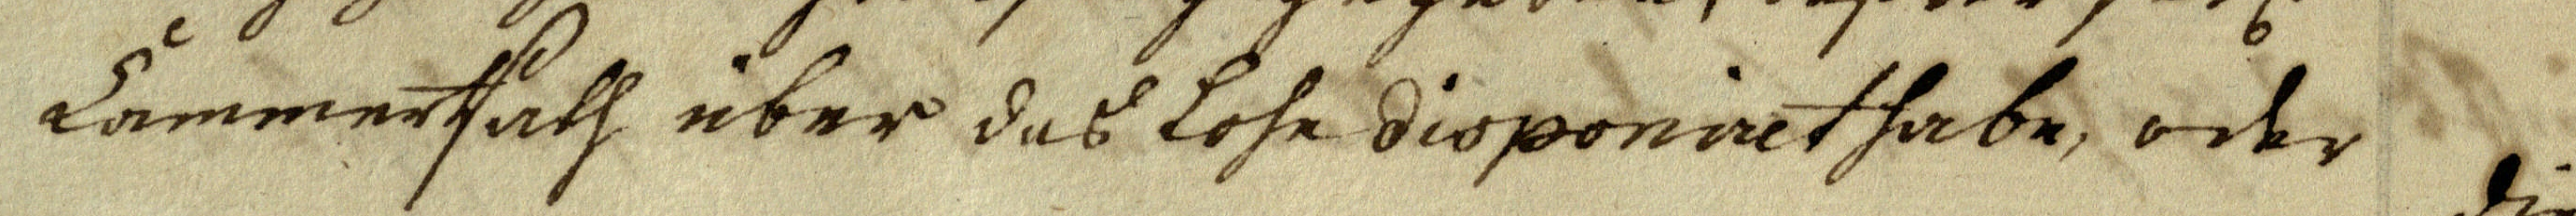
CammerRath über das Lohn disponiret habe, oder
